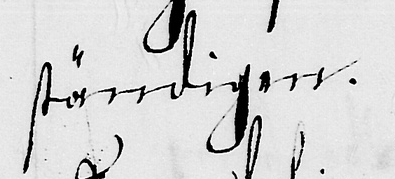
ständigen.
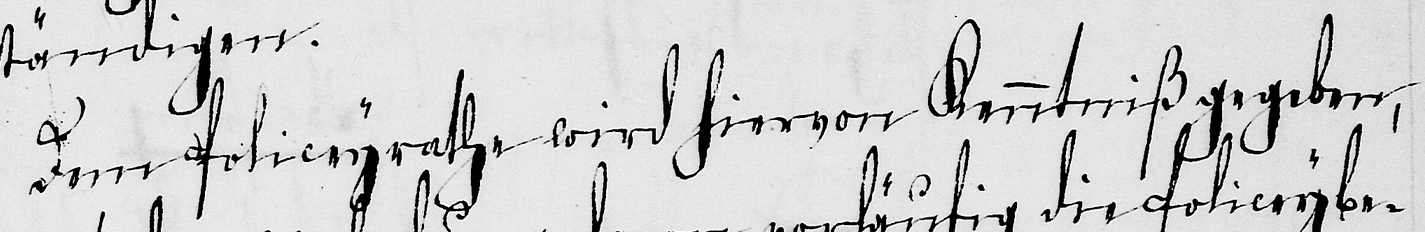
Dem Policeyrathe wird hiervon Kenntniß gegeben,
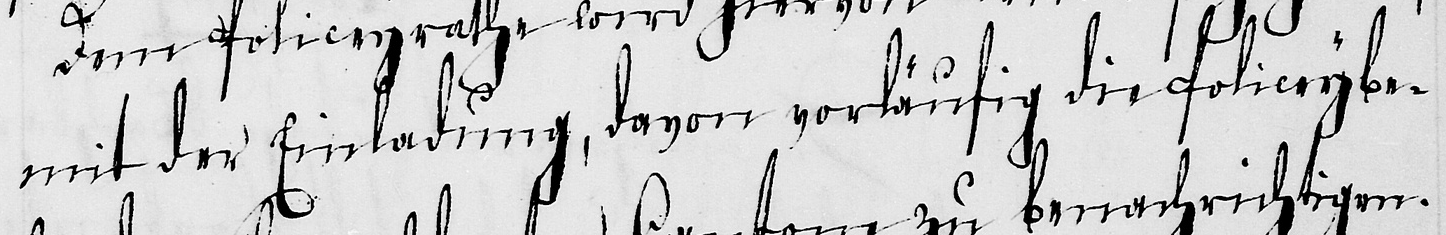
mit der Einladung, davon vorläufig die Policeybe¬
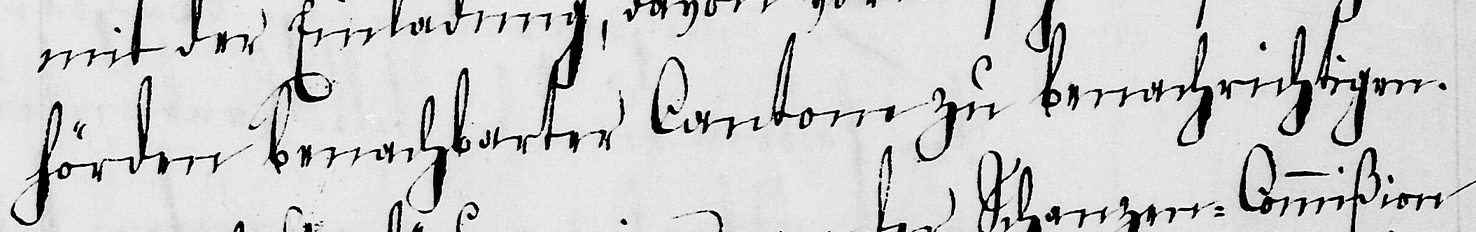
hörden benachbarter Cantone zu benachrichtigen.
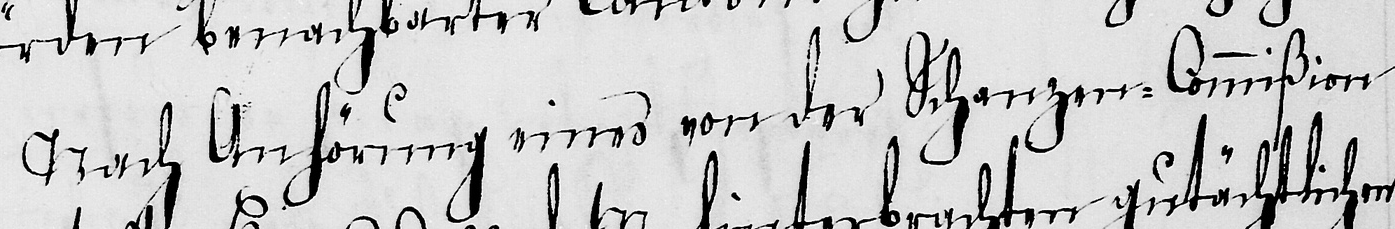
Nach Anhörung eines von der Schanzen-Commißion
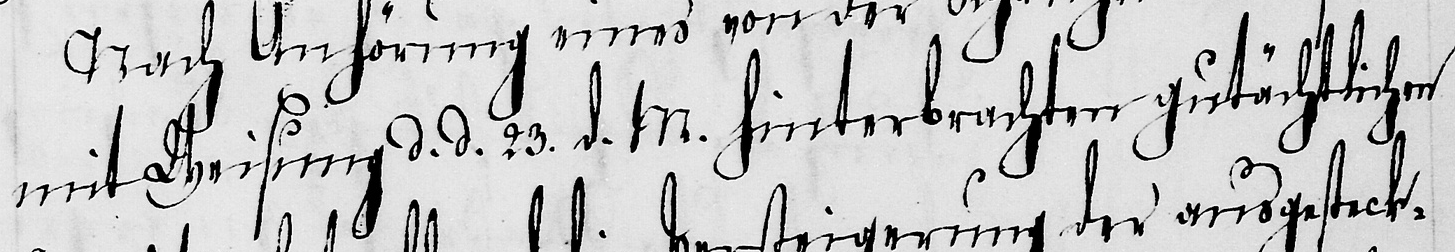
mit Weisung d. d. 23. d. M. hinterbrachten gutächtlichen
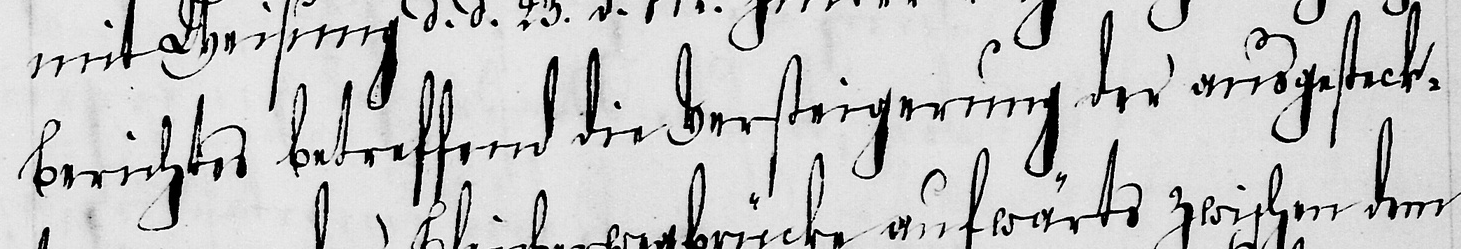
Berichtes betreffend die Versteigerung des ausgesteck¬
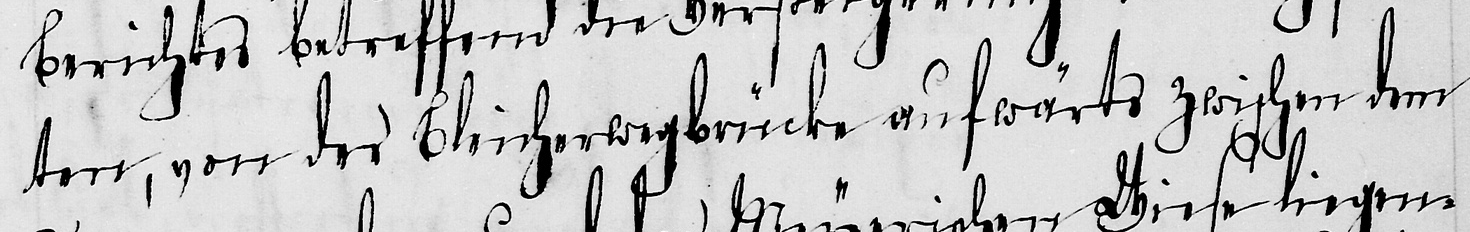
ten, von der Bleicherwegbrücke aufwärts zwischen dem
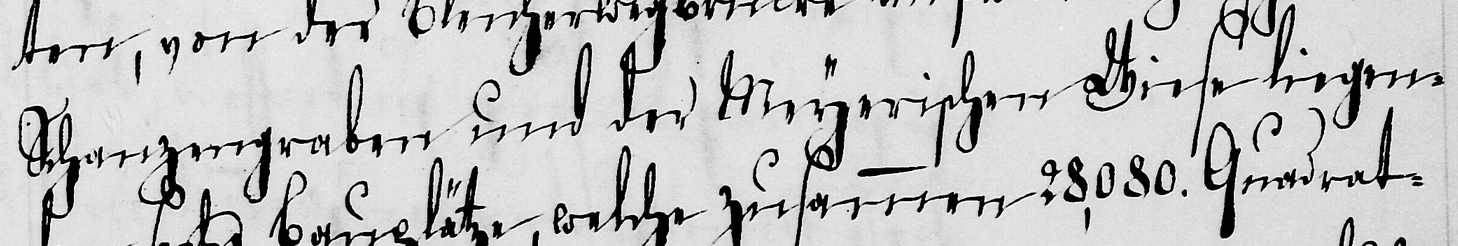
Schanzengraben und der Meyerischen Wiese liegen¬
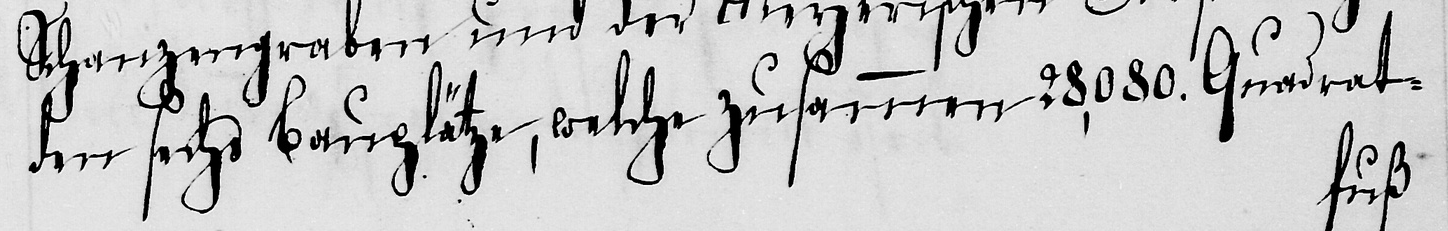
den sechs Bauplätze, welche zusammen 28,080. Quadrat-
